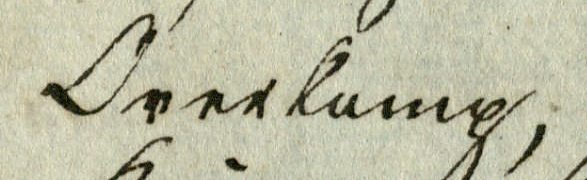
Overkamp,
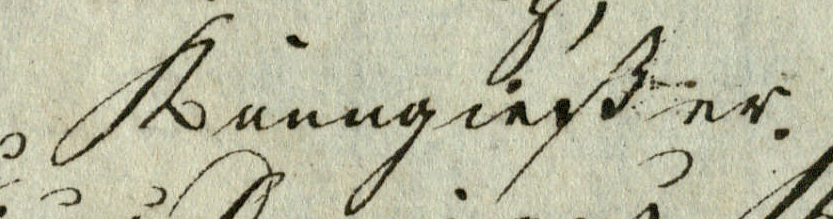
Kanngießer.
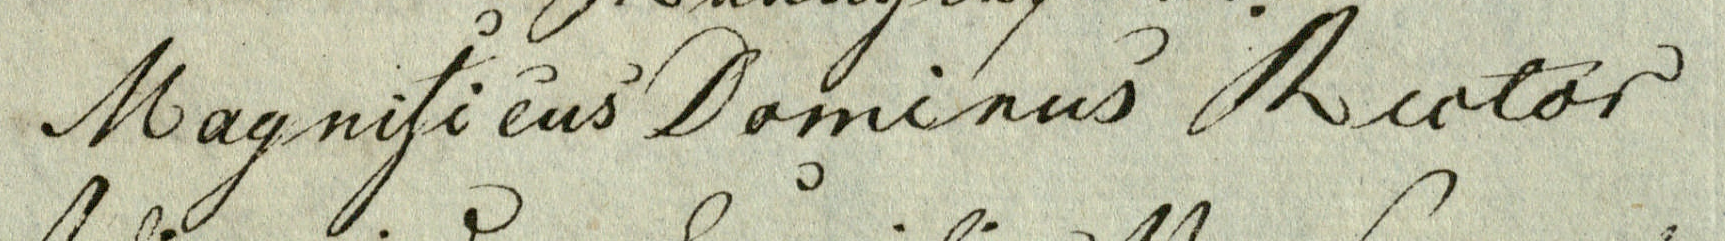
Magnificus Dominus Rector
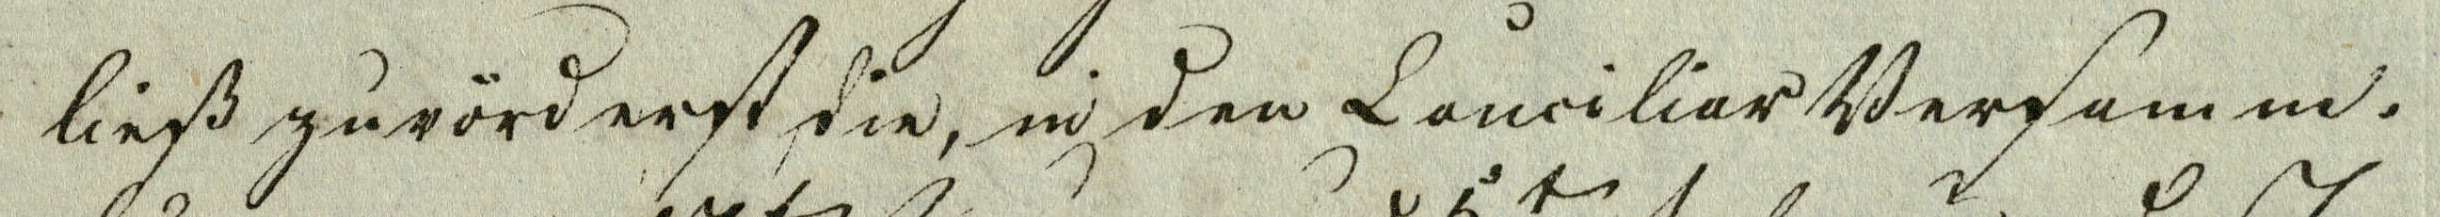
ließ zuvörderst die, in den Conciliar Versamm¬
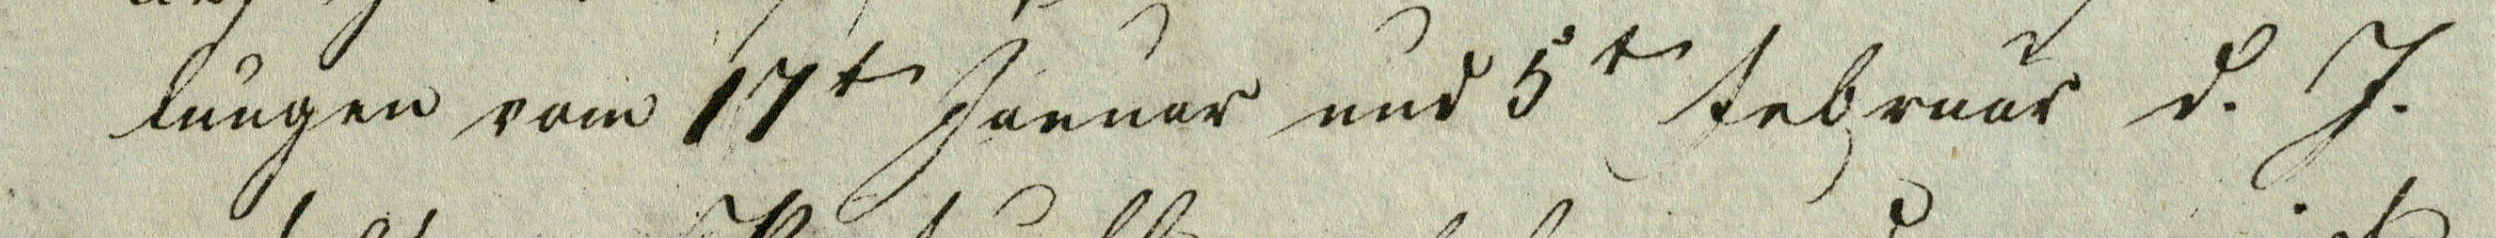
lungen vom 17ten Januar und 5ten Februar d. J.
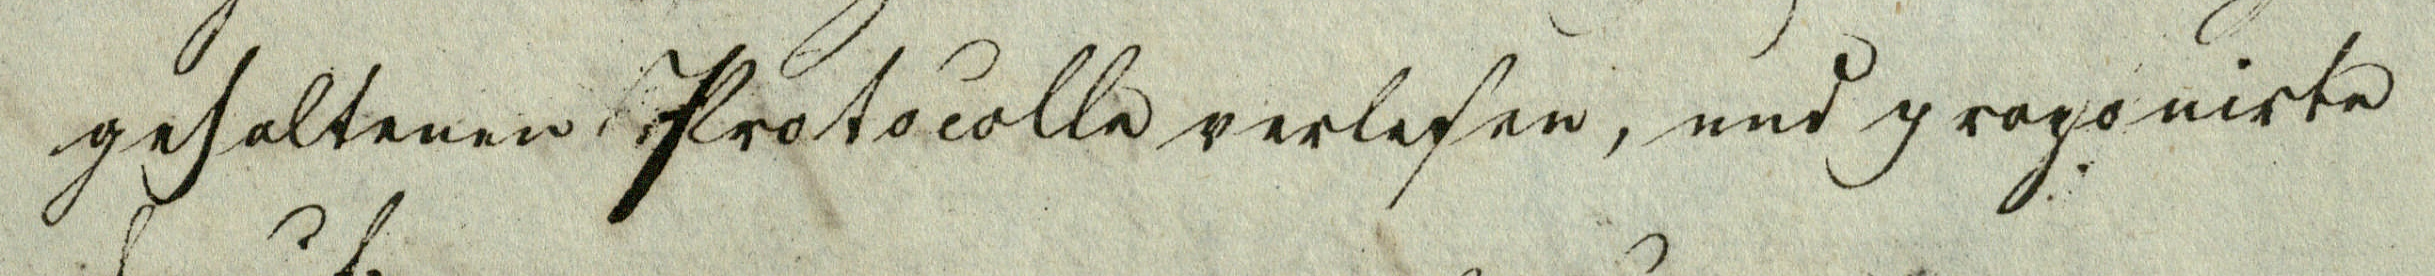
gehaltenen Protocolle verlesen, und proponirte
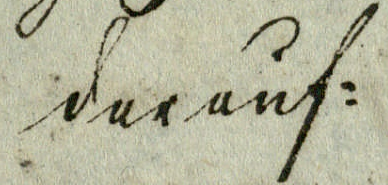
darauf:
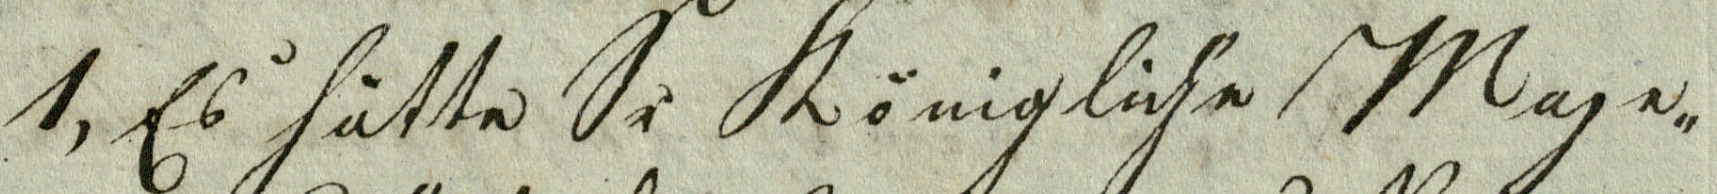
1, Es hätte Sr Königliche Maje¬
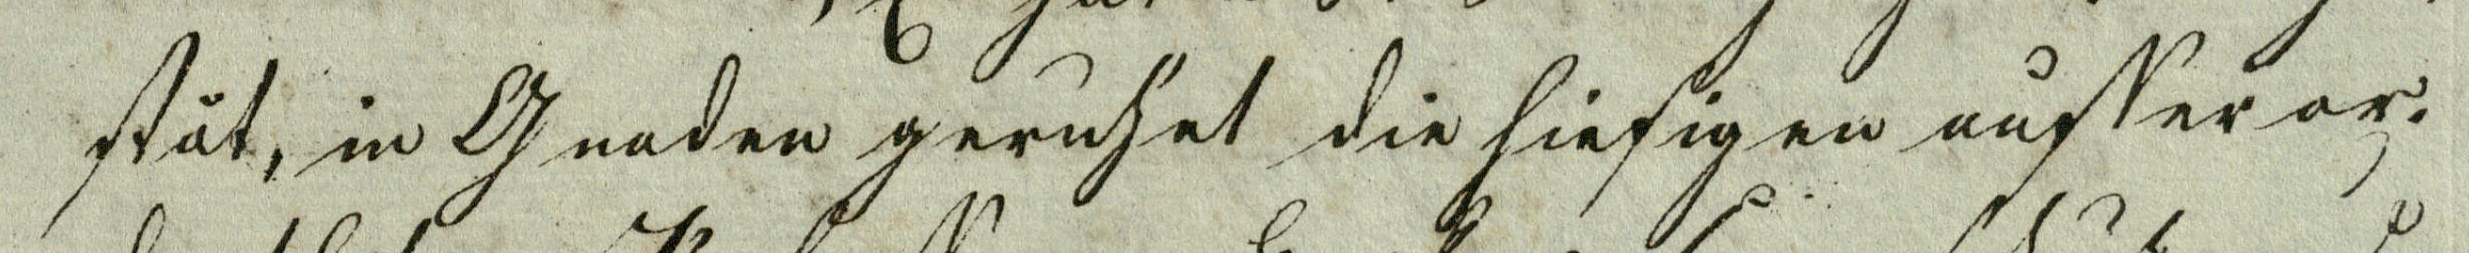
stät, in Gnade geruhet, die hiesigen außeror¬
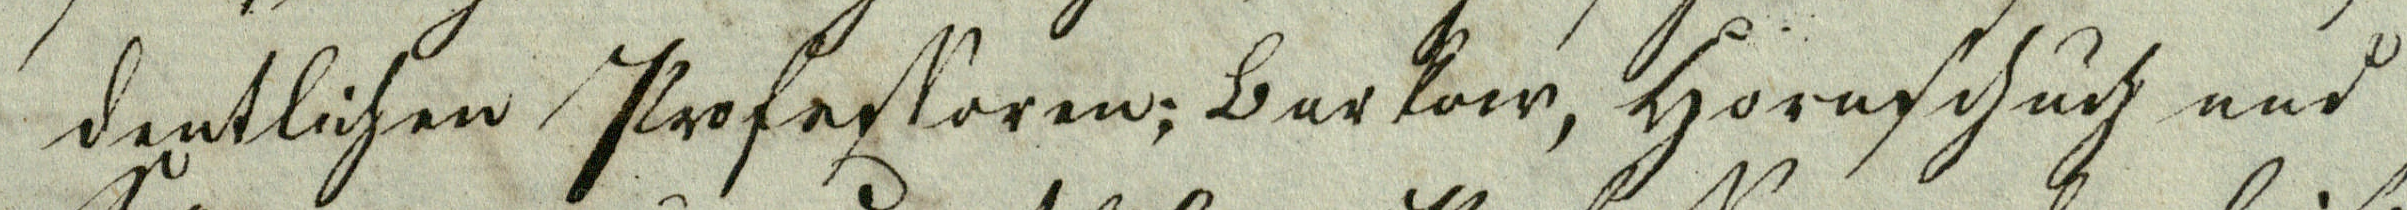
dentlichen Professoren: Barkow, Hornschuch und
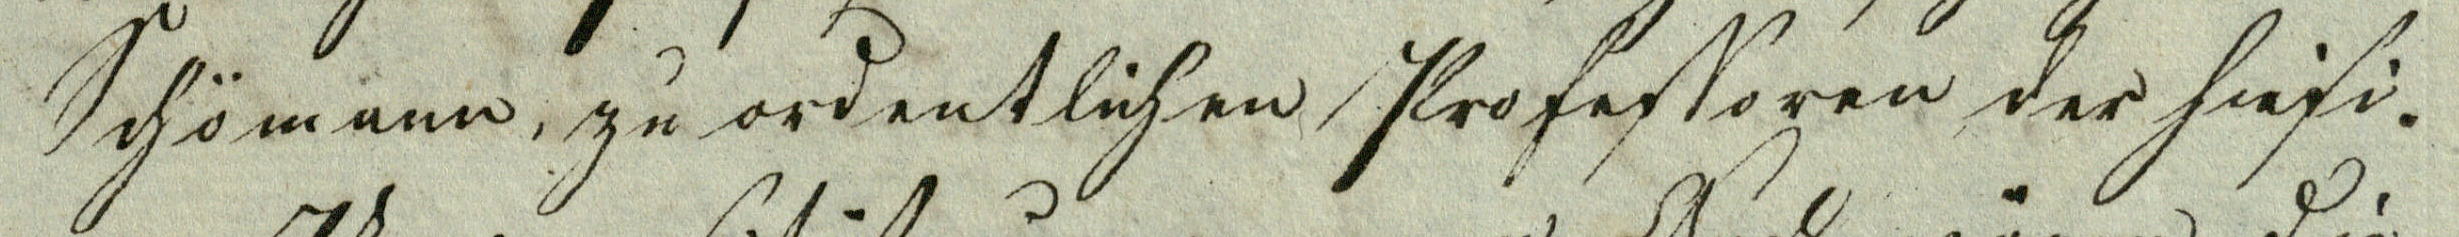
Schömann, zu ordentlichen Professoren der hiesi¬
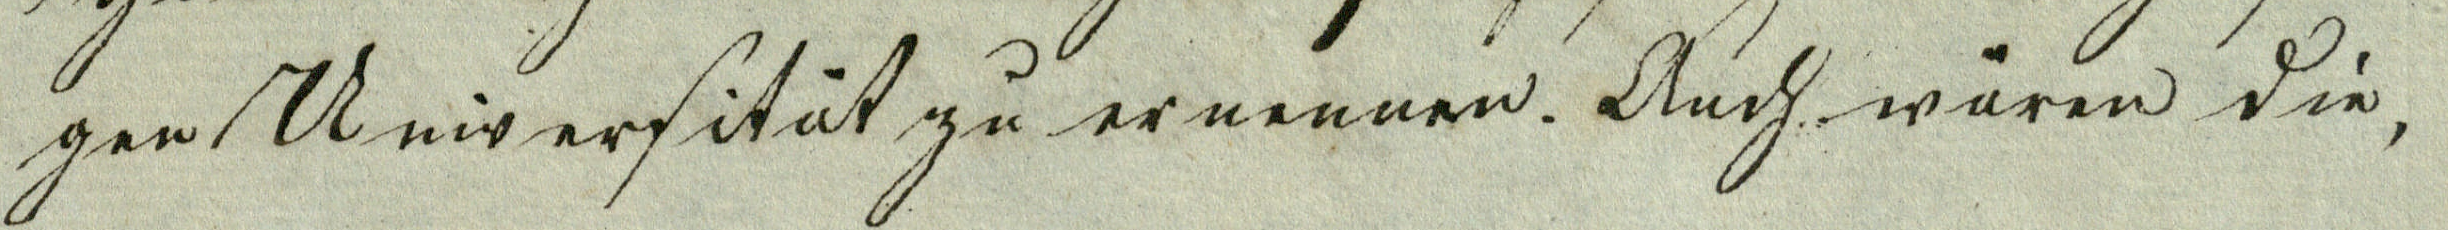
gen Universität zu ernennen. Auch wären die,
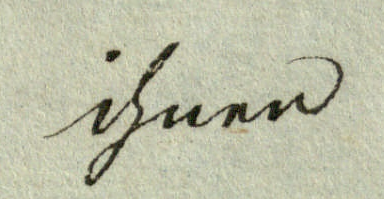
ihnen
